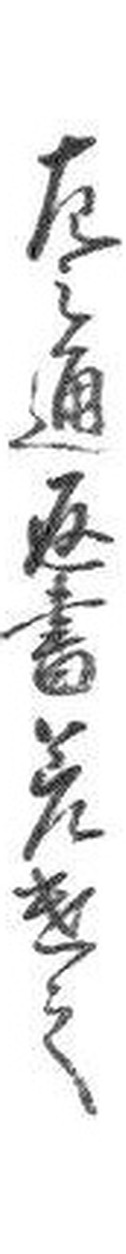左之通返書差遣之
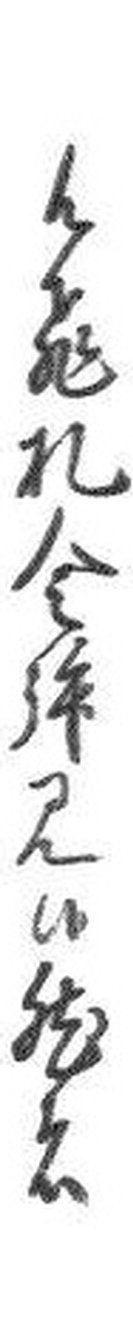御飛札令拝見候然者
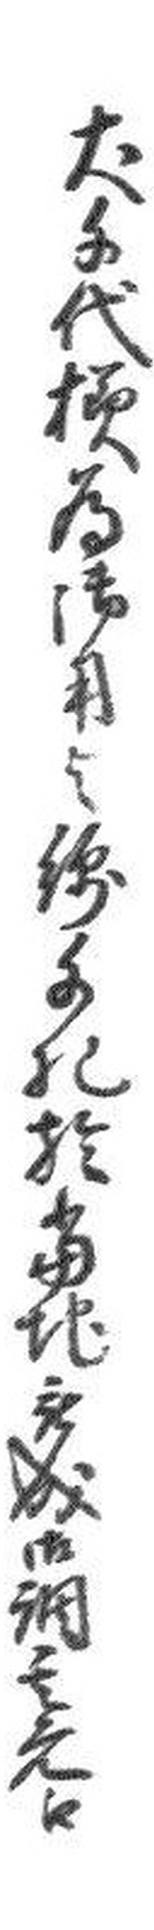犬千代様為御用与綿千把於当地被成御調其元江
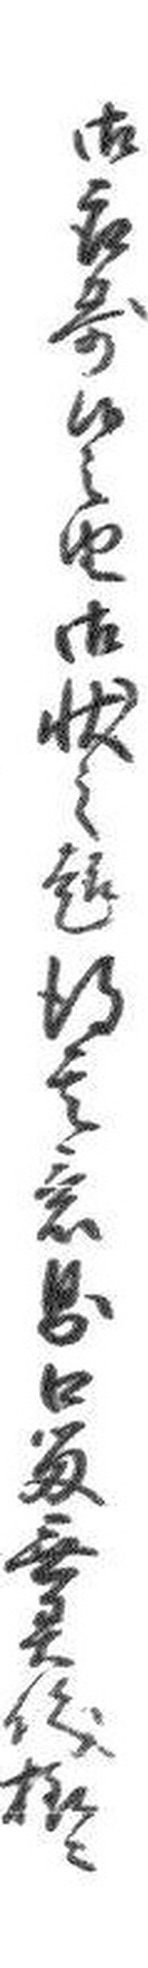御取寄候之由御状之趣得其意則口留無異儀様ニ
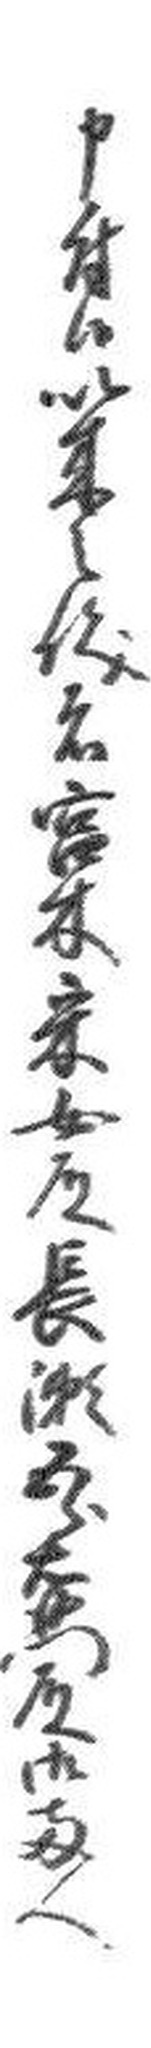申付候以来之儀者宮木采女殿長瀬五郎右衛門殿御両人
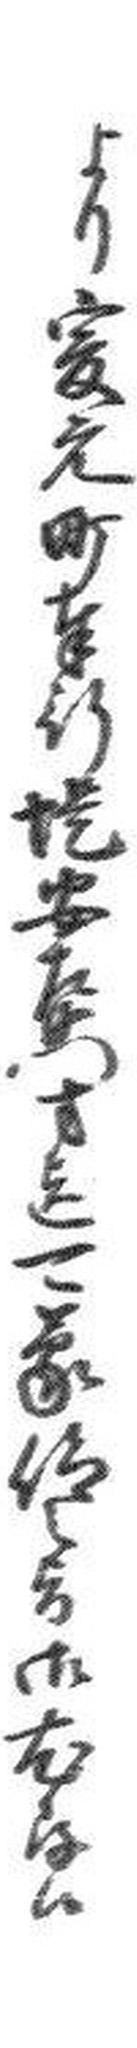より爰元町奉行堤安左衛門方迄可蒙仰之旨御尤存候
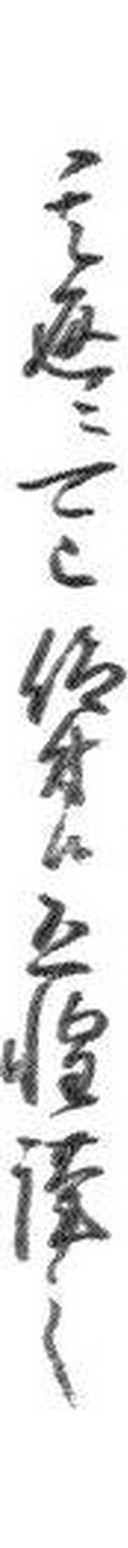其通ニ可被仰付候恐々謹言
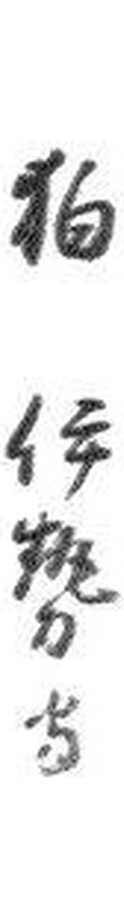狛伊勢守
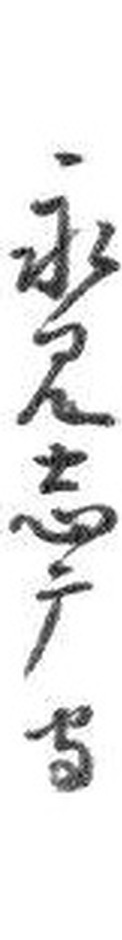永見志摩守
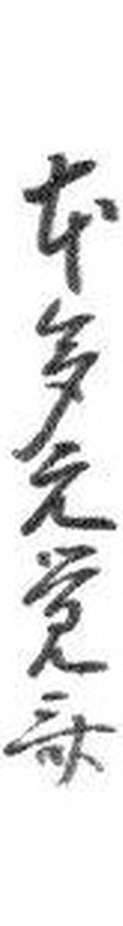本多元覚斎
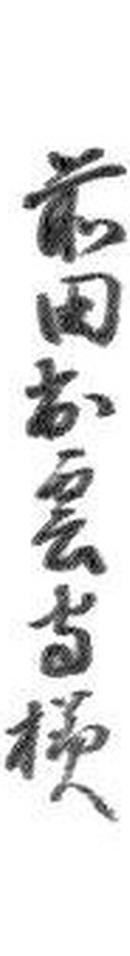前田出雲守様

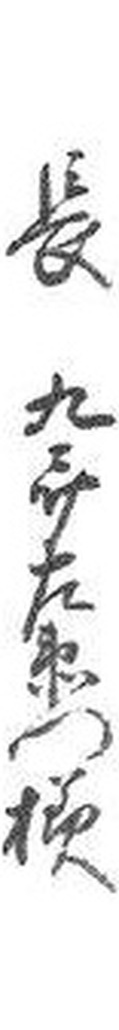長九郎左衛門様
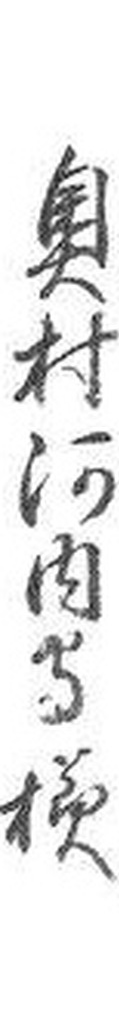奥村河内守様
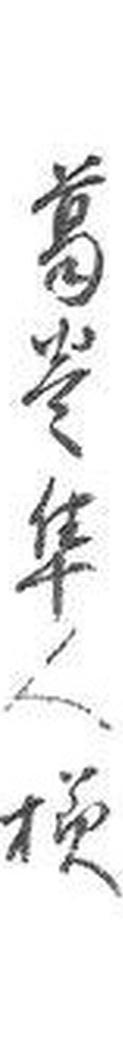葛巻隼人様
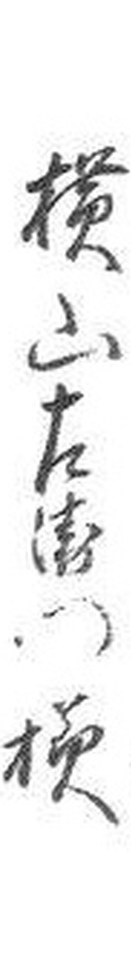横山左衛門様
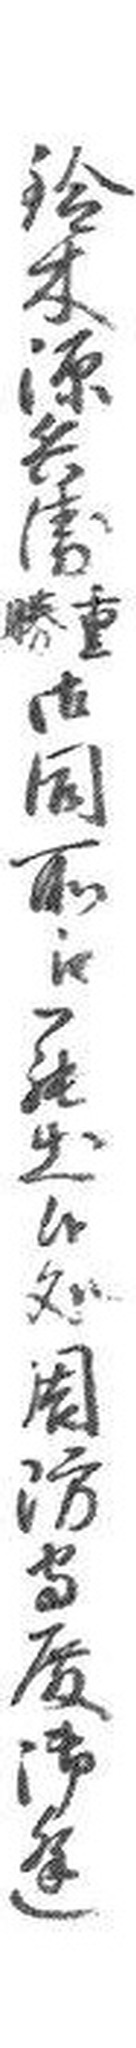鈴木源兵衛重勝御同所江罷出候処周防守殿御逢
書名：家譜 五 光通公 従寛永十三年到万治二年
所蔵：福井県文書館 Fukui Prefectural Archives
